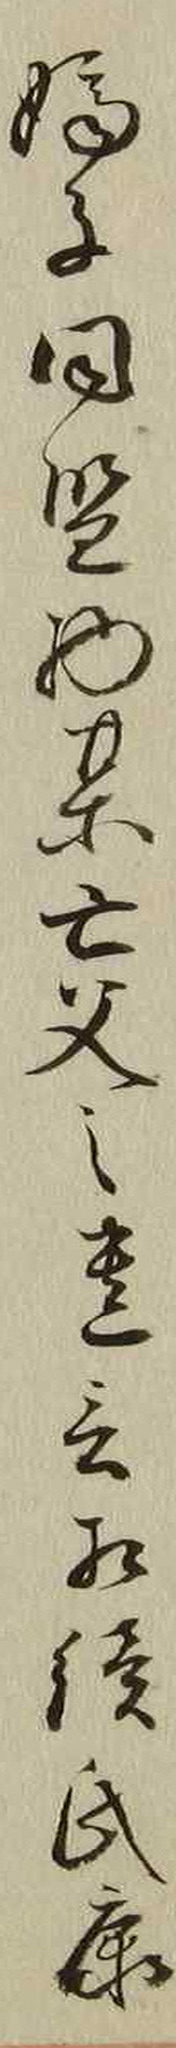嫡子同監物某亡父之遺言相続氏康
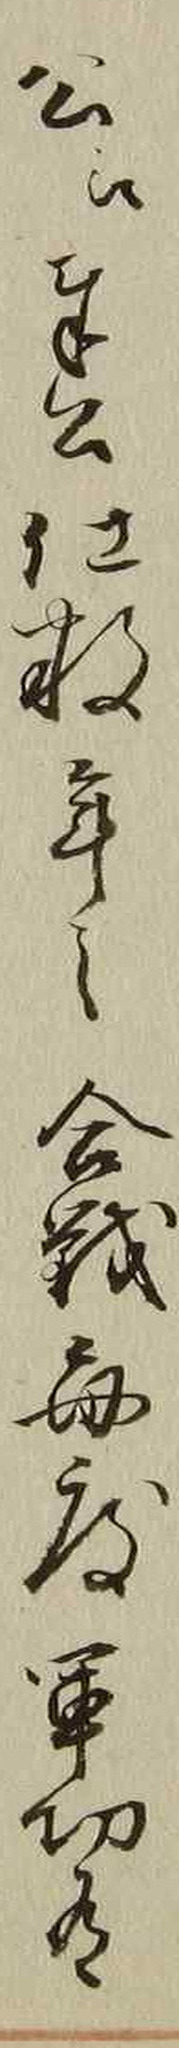公江奉公仕数年之合戦毎度軍功有
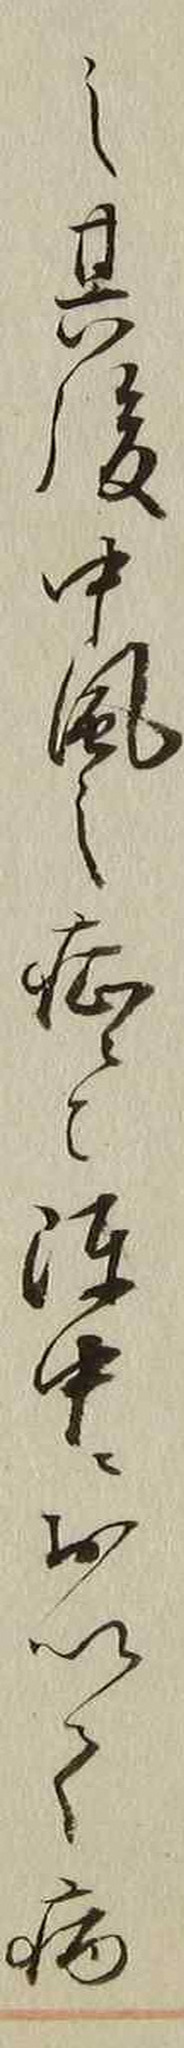之其後中風之病ニて陣中ニおいて病
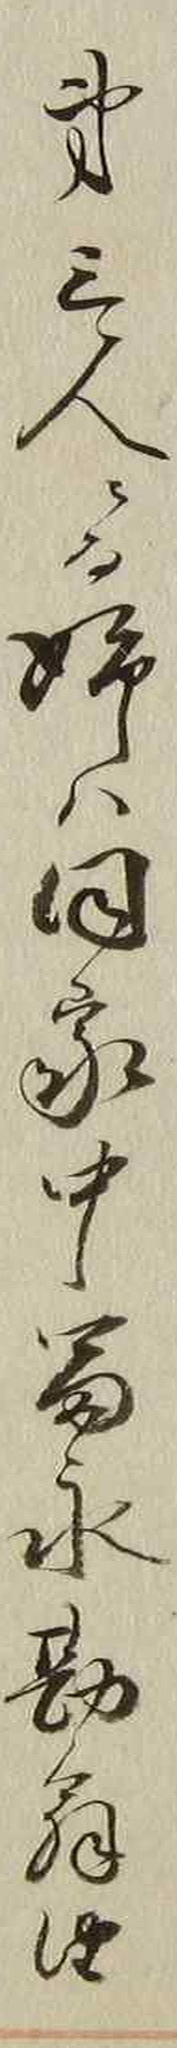弟三人ニ而姉ハ同家中富永勘解由
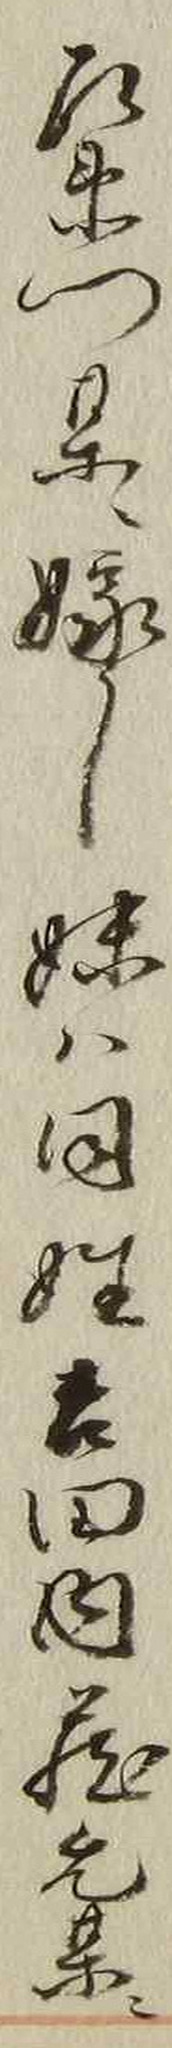左衛門某へ嫁し妹ハ同姓吉田内蔵允某ニ
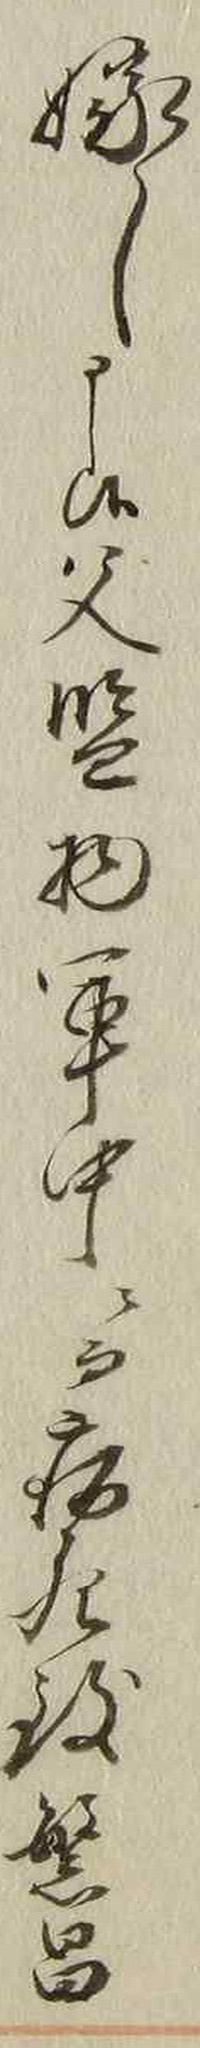嫁し申候父監物軍中ニ而病死致繁昌
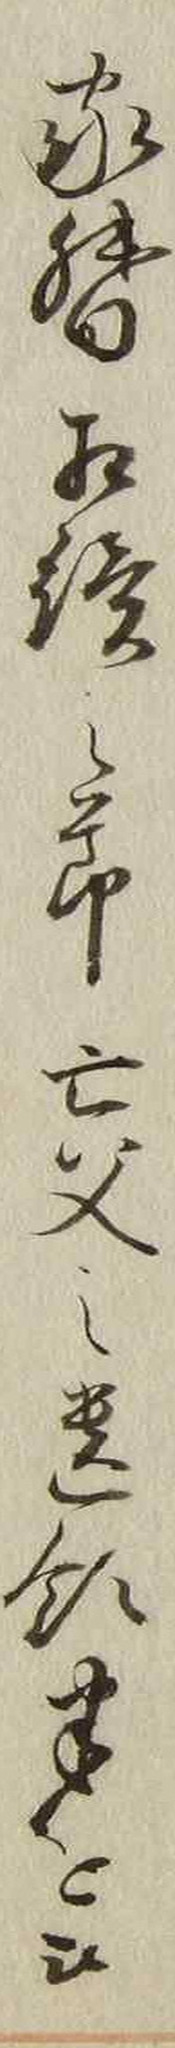家督相続之節亡父之遺領半を被
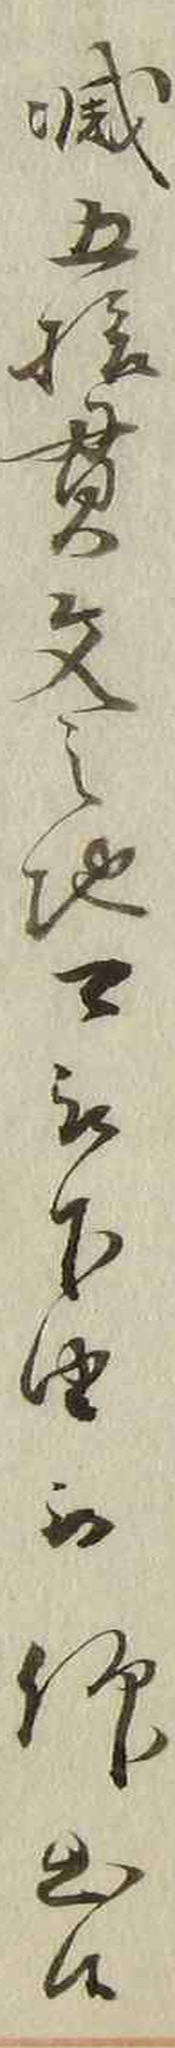減五拾貫文之地可被下由被仰出候
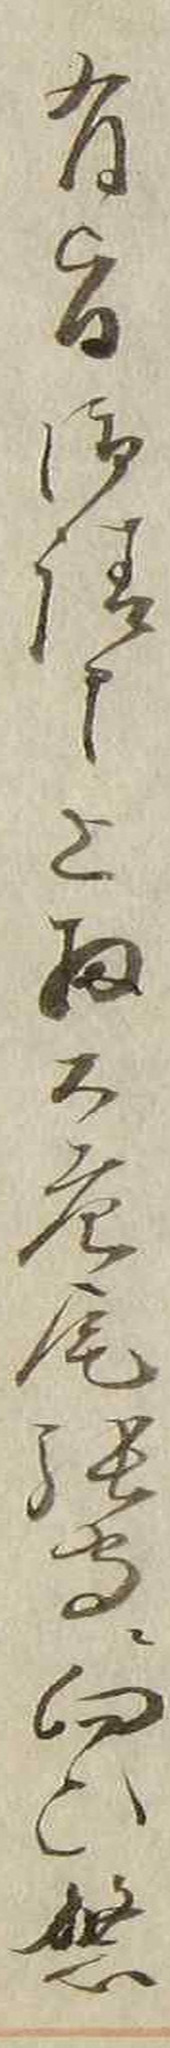有旨御請申上扨大老尾張守ニ向ひ繁
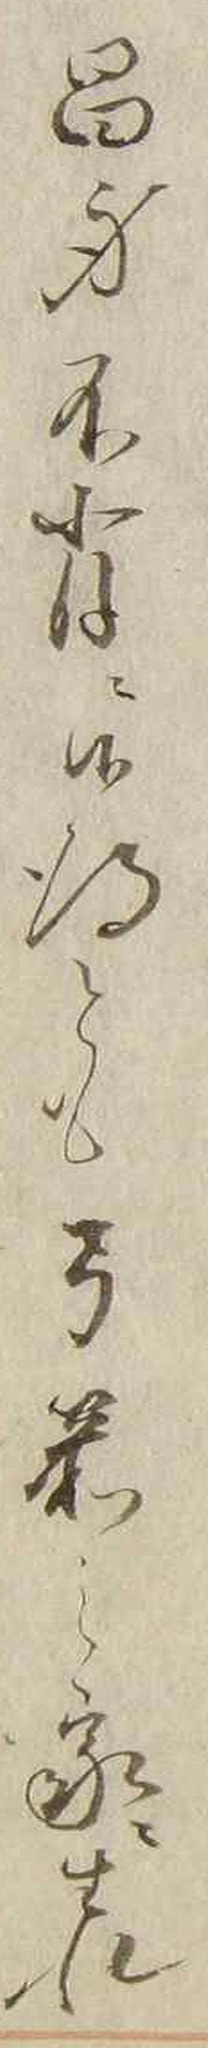昌身不肖ニ候得とも弓箭之家ニ生れ

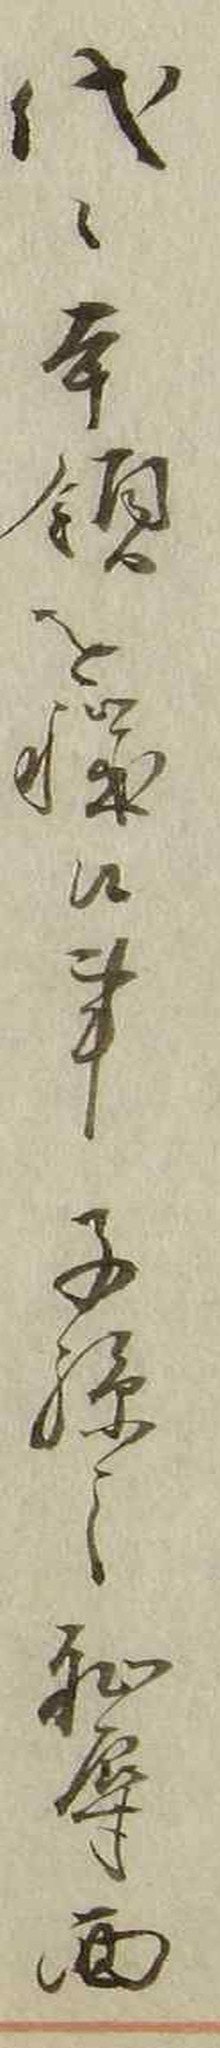代々本領を穢候事子孫之恥辱面
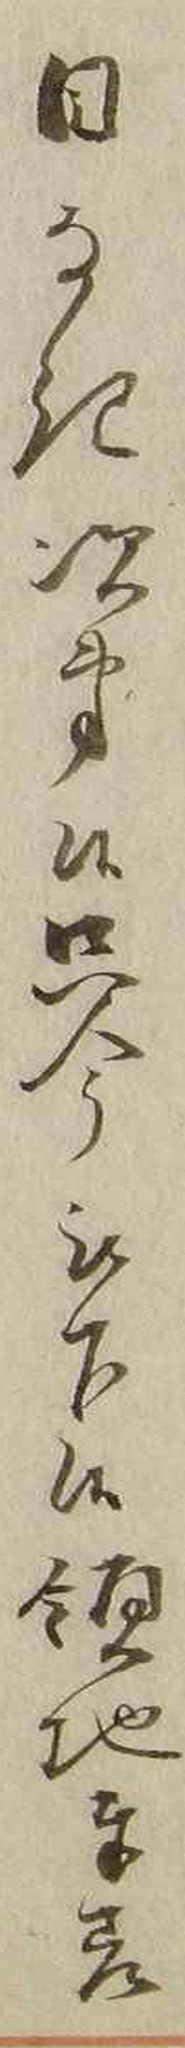目なき次第候只今被下候領地奉差
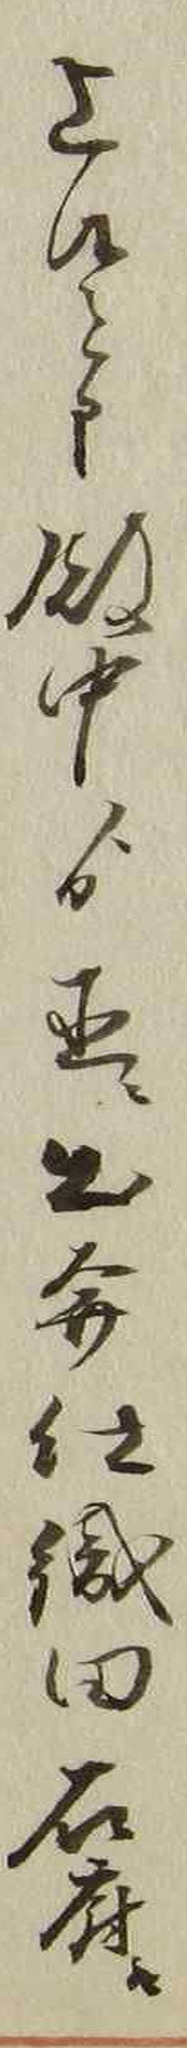上候と申殿中ゟ直ニ出奔仕織田右府江
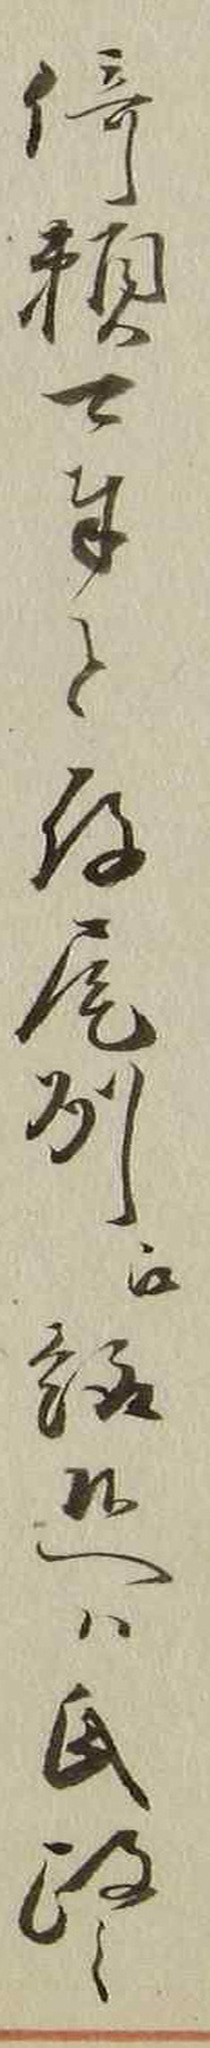倚頼可奉と存尾州江趣候へハ氏政之
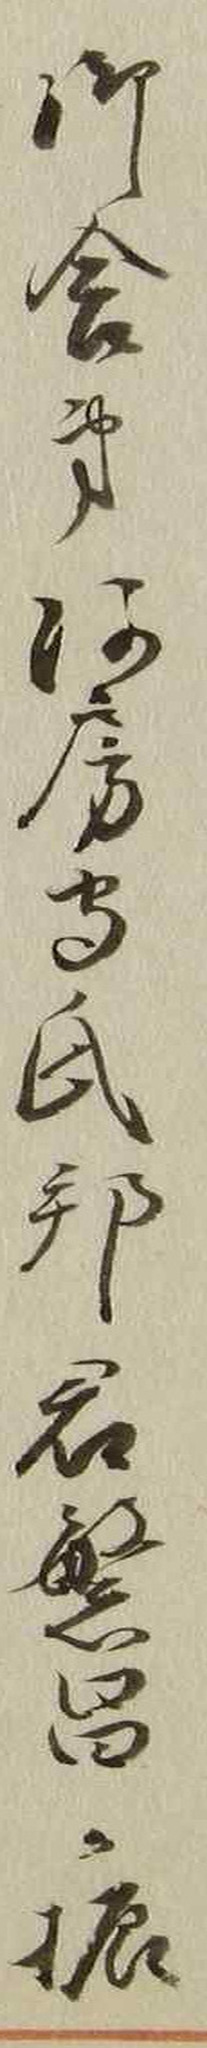御舎弟阿房守氏邦君繁昌か振
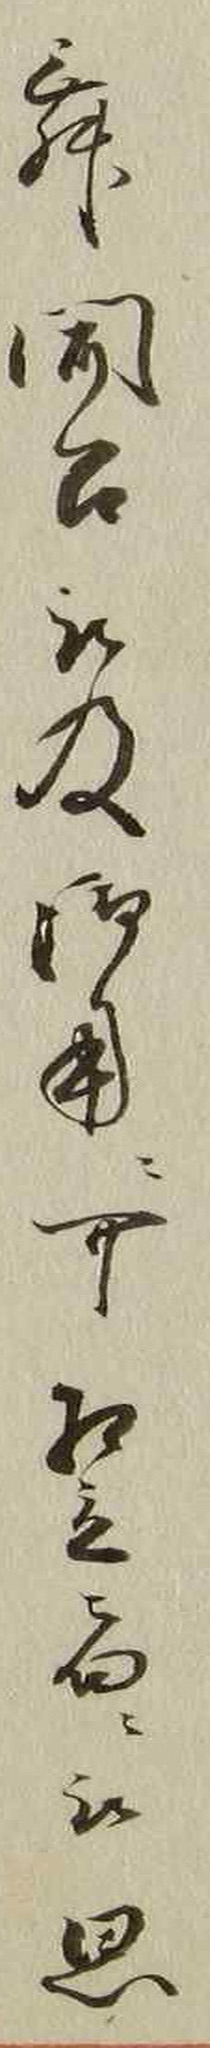舞聞召被及御用ニ可相立者ニ被思
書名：諸士系譜　巻之122　よ之部5
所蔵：会津若松市立会津図書館
